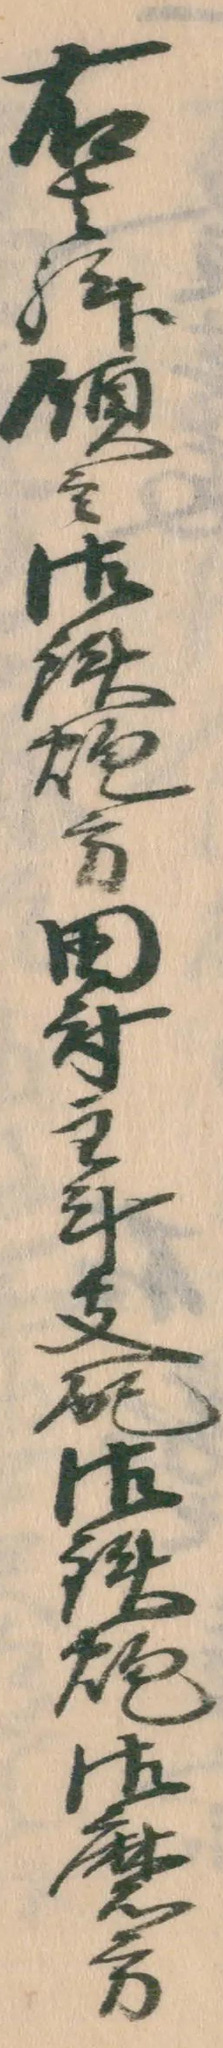右は拝領主御鉄砲方田付主計支配御鉄砲御磨方
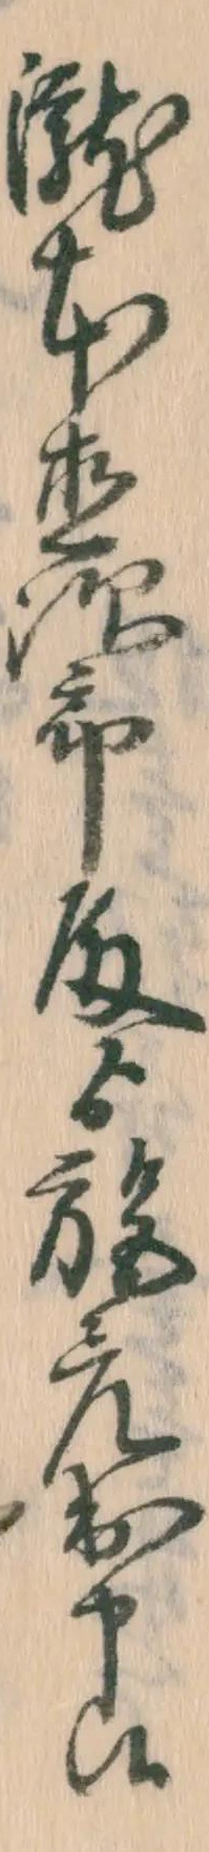瀧本直次郎殿ゟ施差出申候
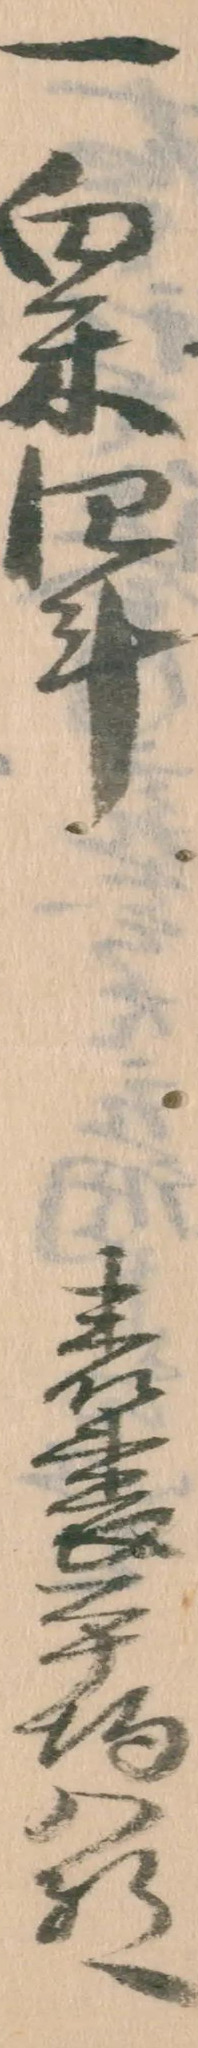一白米四斗表裏平均八軒へ
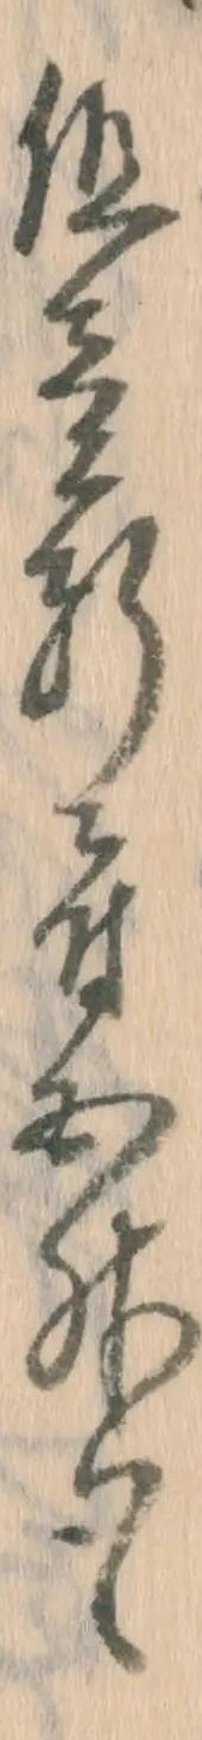但壱軒ニ付五升ツヽ
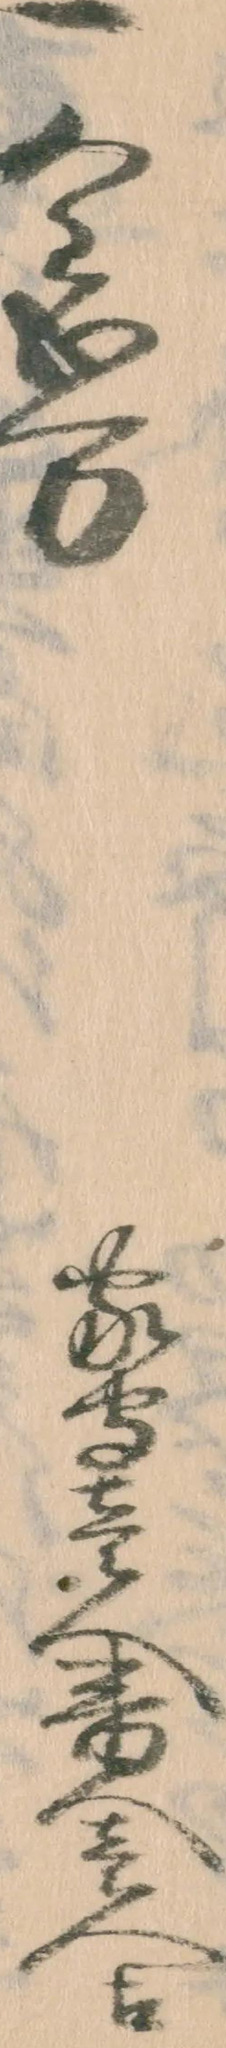一金弐分家守壱人番人壱人え
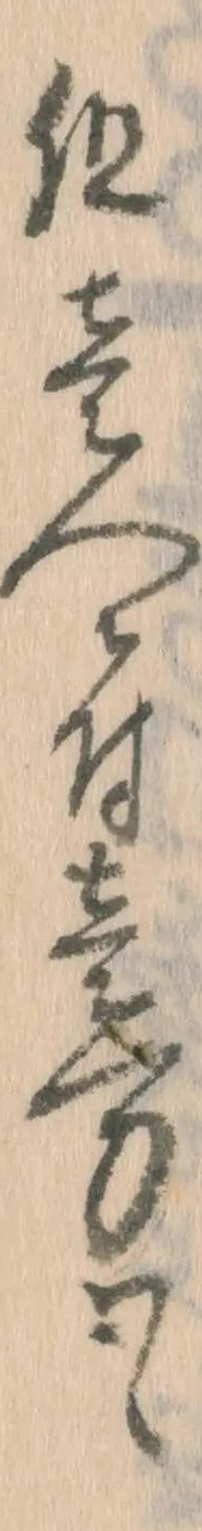但壱人ニ付壱分ツヽ
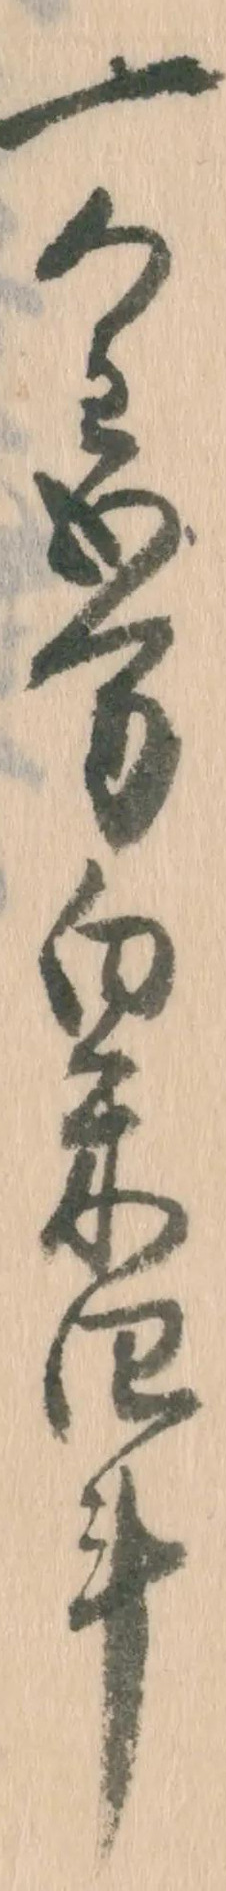〆金弐分白米四斗
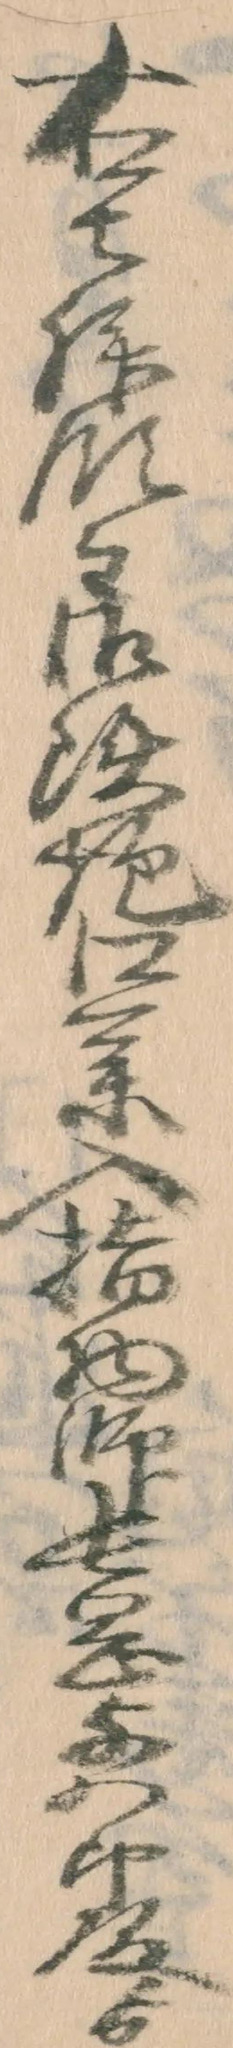右は拝領主御鉄砲口薬入指物師長岡与八郎殿ゟ
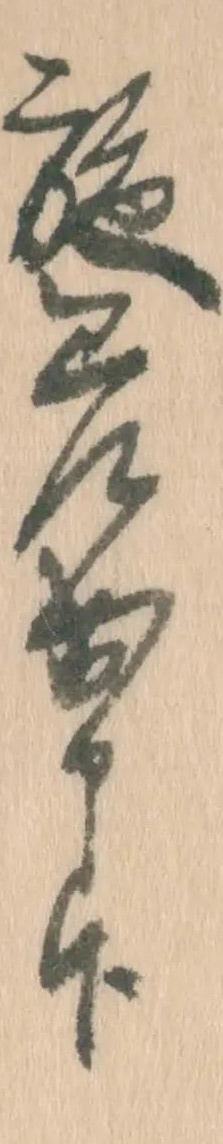施差出申候

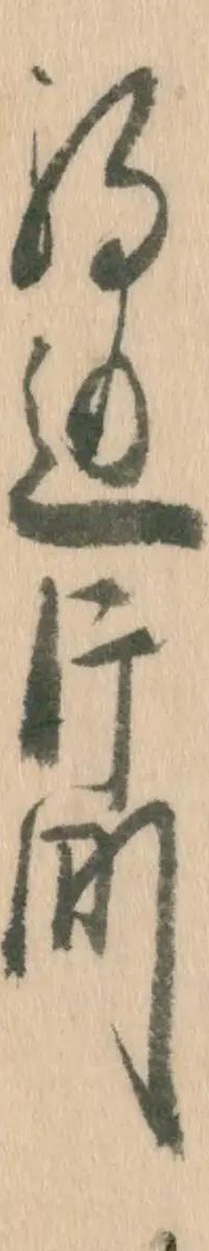駒込片町
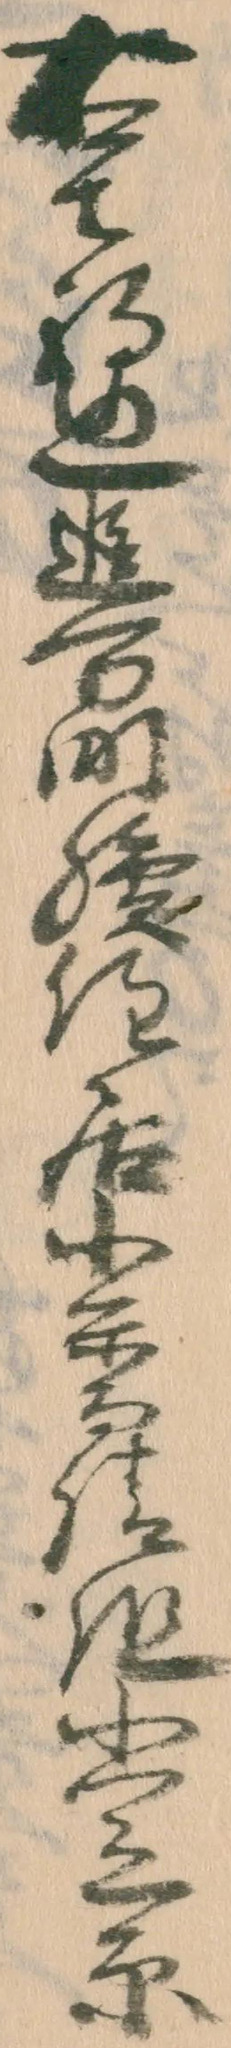右は駒込追分町続住居小普請組小笠原
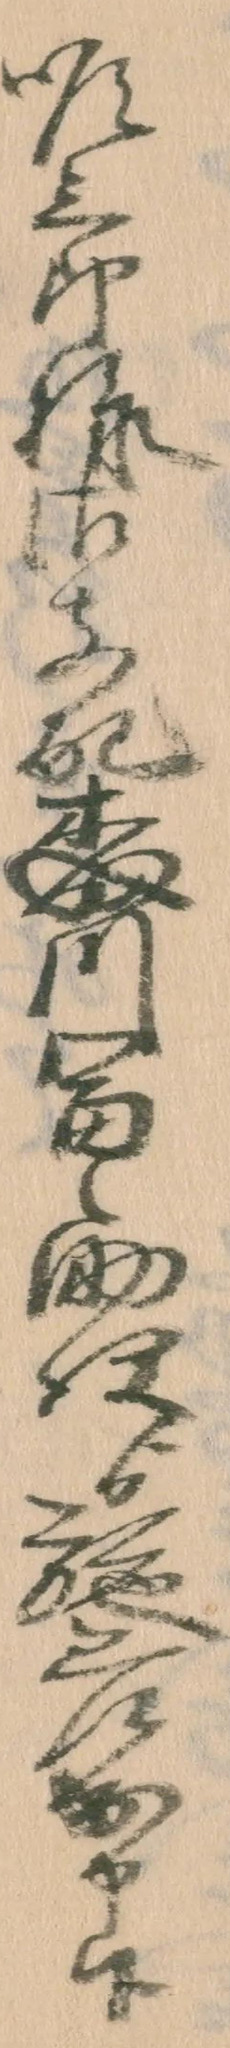順三郎様御支配森川冨之助様ゟ施差出申候
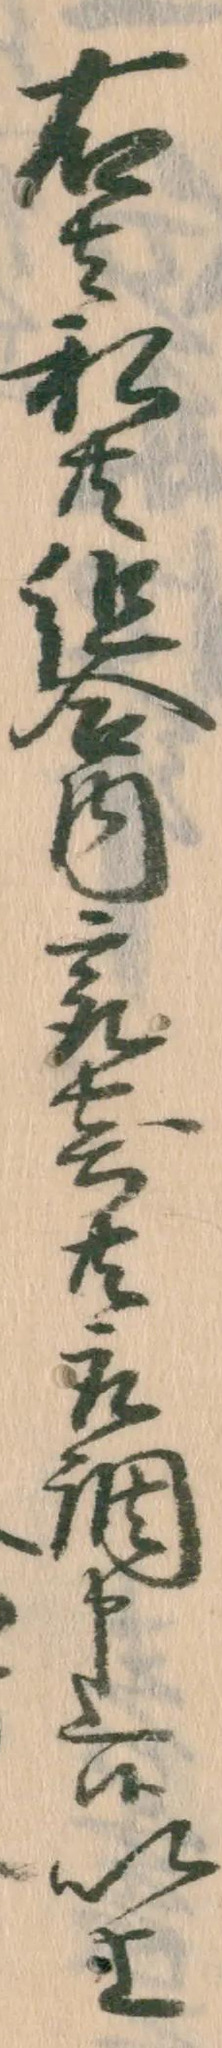右は私共組合内最寄共取調申上候以上
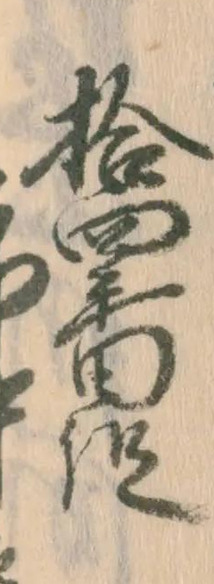拾四番組
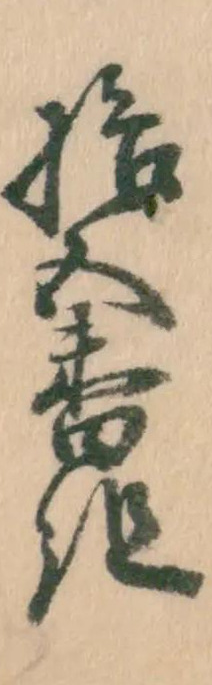拾五番組

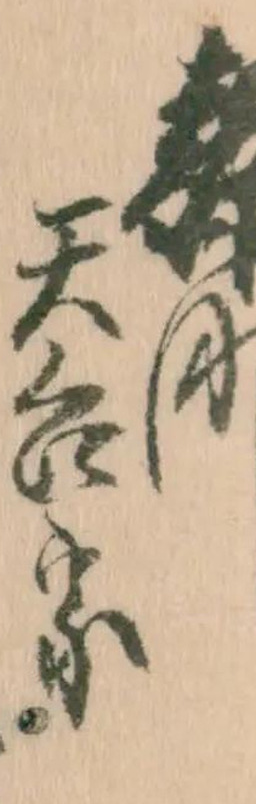天台宗
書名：武家方并寺院等ニテ施差出候一件
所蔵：国立国会図書館 National Diet Library, JAPAN
